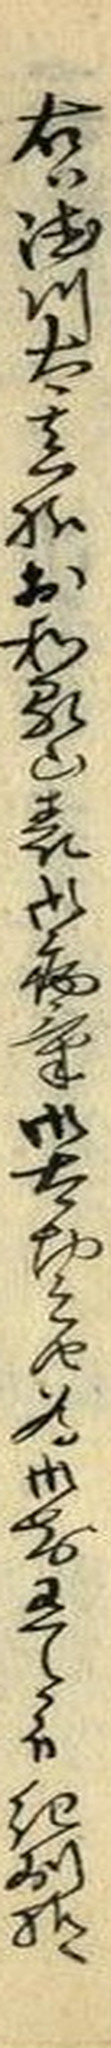右ハ徳川真様於和歌山表御病気御太切之由為御知有之候ニ付紀州様へ
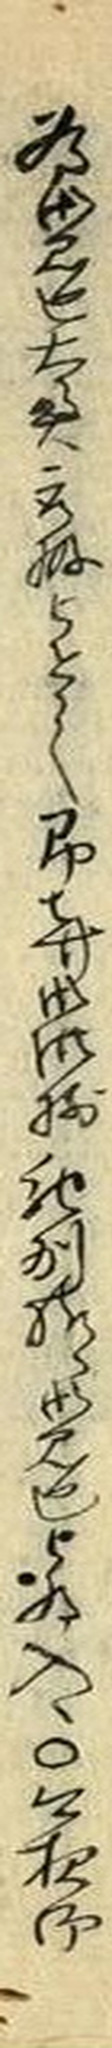為御見廻大奥取扱被進之即刻御供揃紀州様へ御見廻被為入候○今夜御
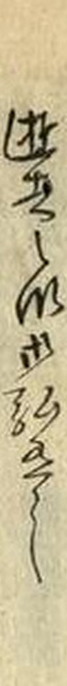逝去之段御弘有之
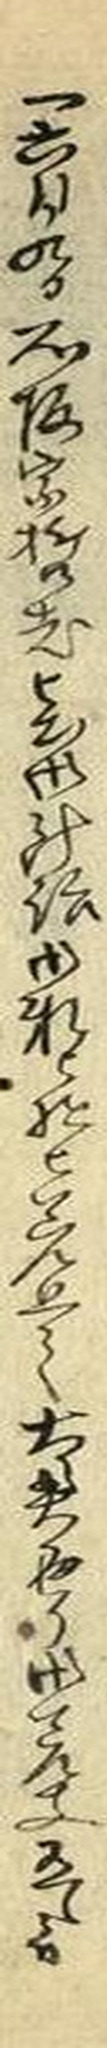一六月九日石坂宗哲老被出御針治御頼被遊被差上之大奥通り御差支有候ニ付
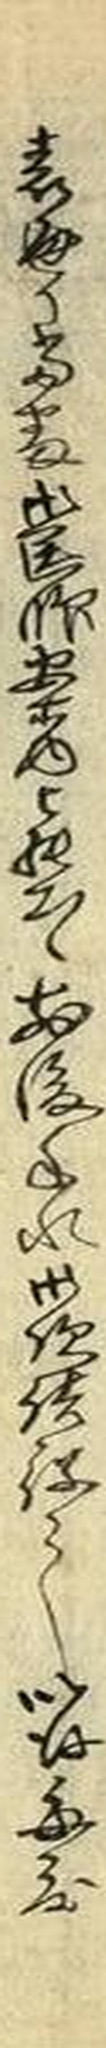表通り当番御医師案内被罷出候前後手水御次詰役之以後毎度
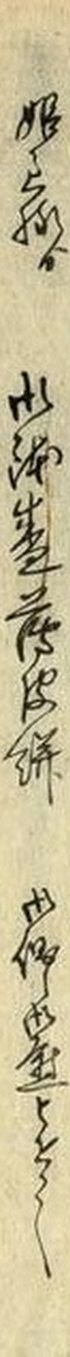姫君様ゟ御鉢盛薄皮餅御側御慰被進之
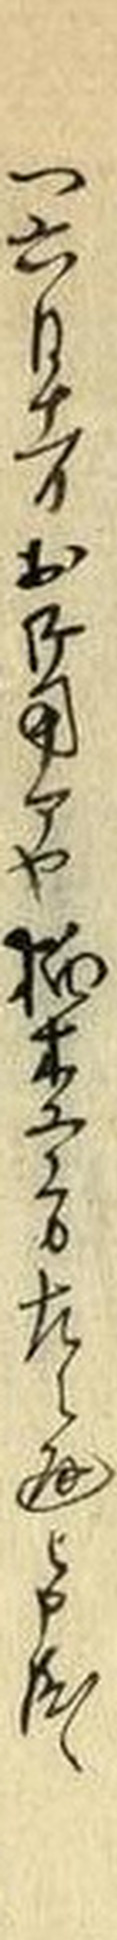一六月十一日於御用部や狛木工方左之通被申渡候
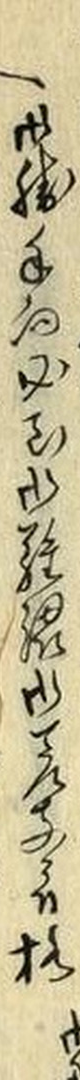御勝手向必至御難渋御差支ニ付格
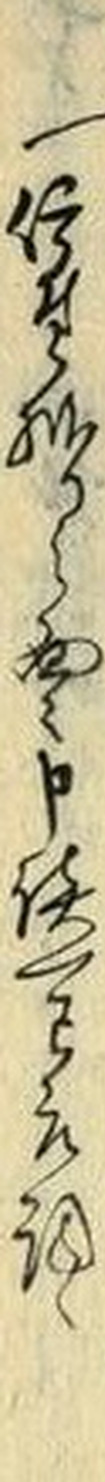仰付候掛り面々申談可被取調候
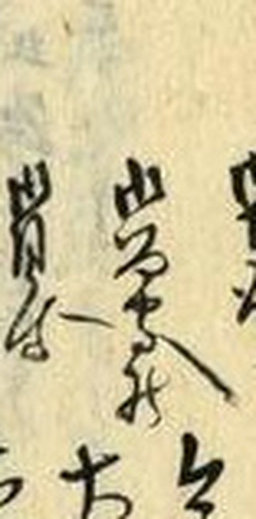御目付
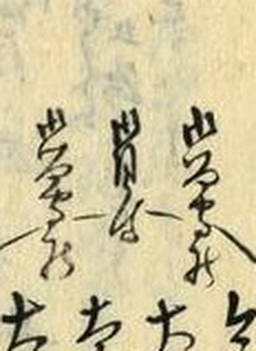御目付
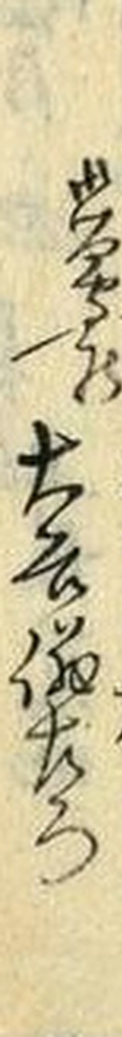御留守居大谷儀左衛門
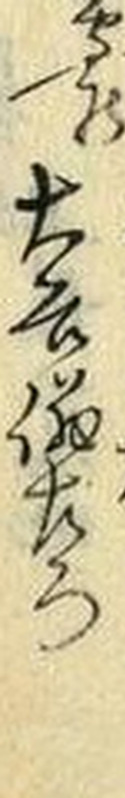御留守居大谷儀左衛門
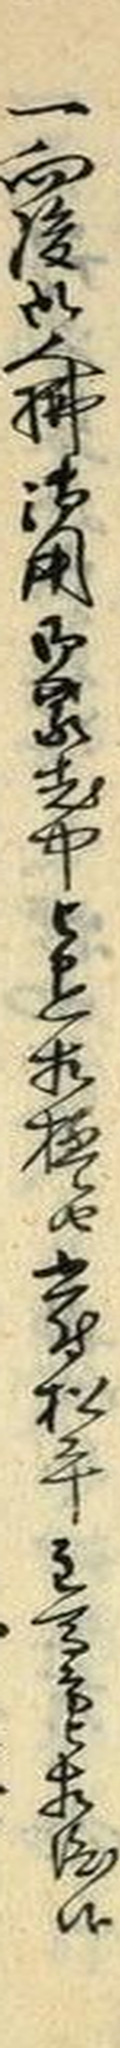一向後御人払御用御家老中被申上相極候由書付松平主馬方被相渡候
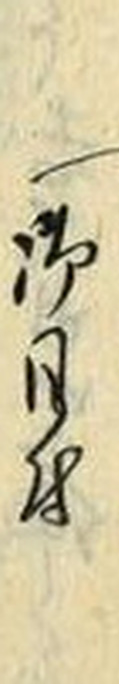御目付
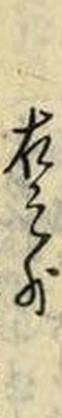右之外
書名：少傅日録抄（斉承付側向頭取日記、在府）
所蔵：福井県文書館 Fukui Prefectural Archives
